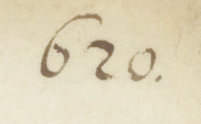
620
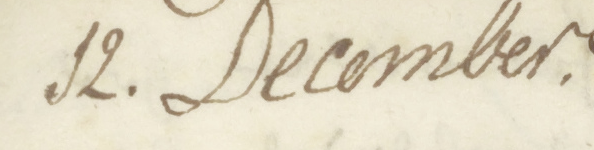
12. December.
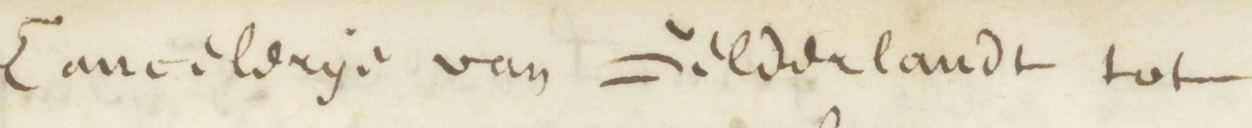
Cancelerije van Gelderlandt tot
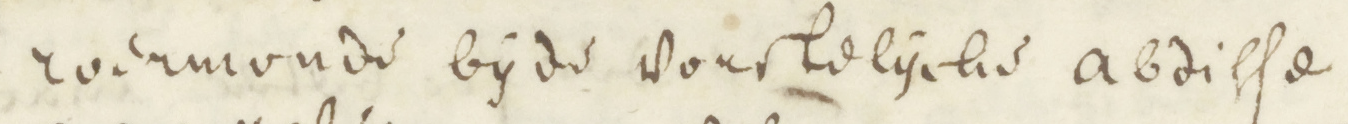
roermonde bijde vorstelijcke abdisse
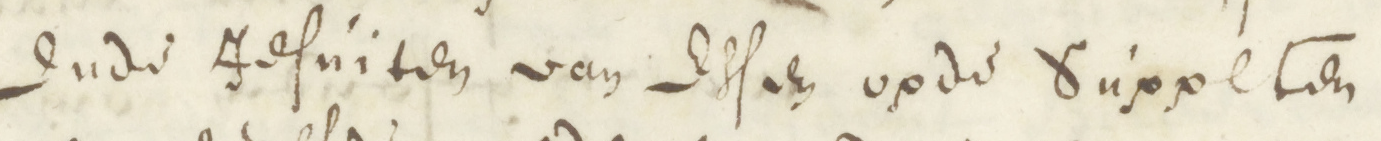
ende Jesuiten van Essen opde Supplten
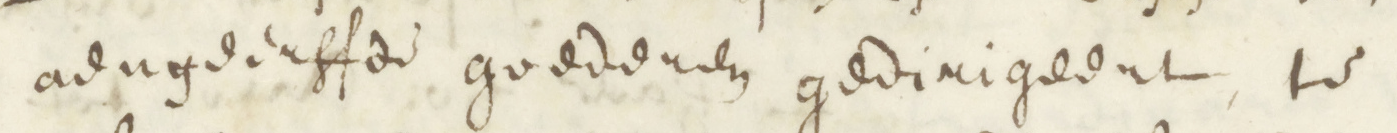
aengeerffde goederen gedirigeert te
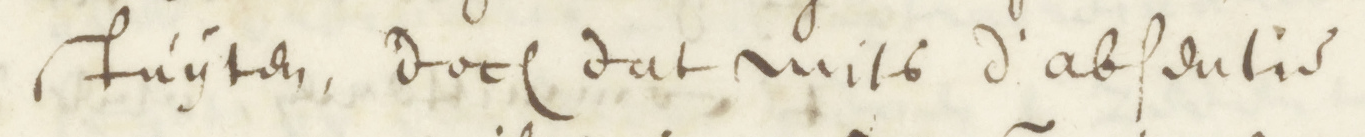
sluijten, doch dat mits d'absentie
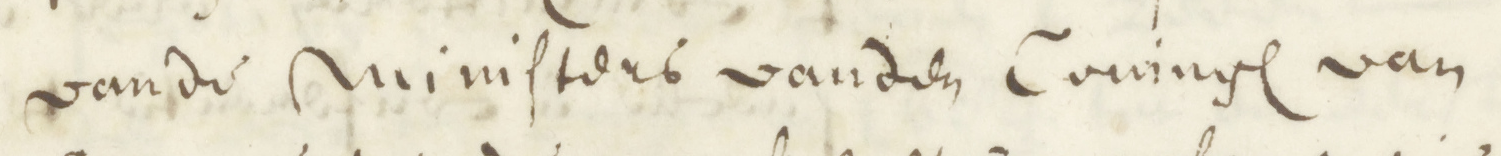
vande ministers vanden Coningh van
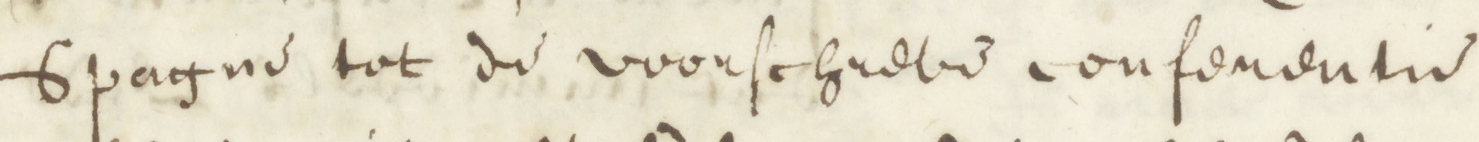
Spagne tot de voorschreve conferentie
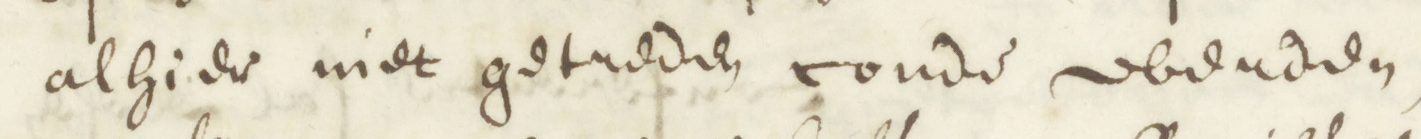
alhier niet getreden conde werden,
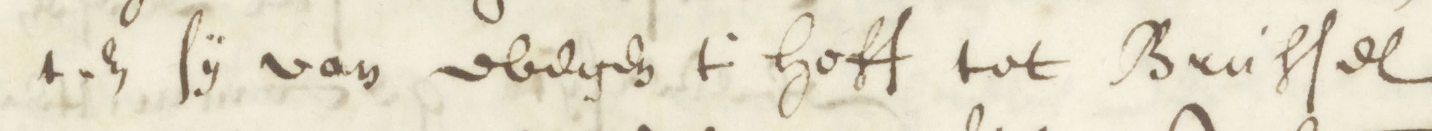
ten sij van wegen t' hoff tot Brussel
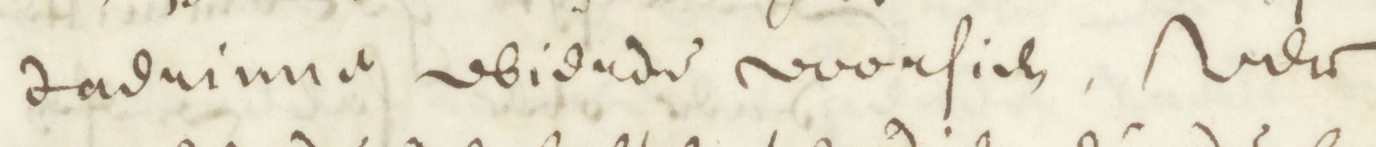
daerinne wierde voorsien. Ver„
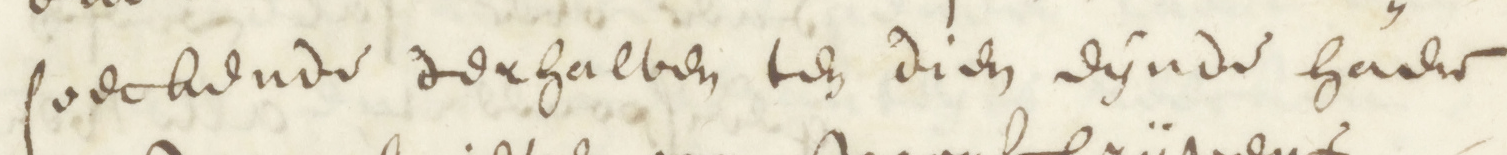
soeckende derhalven te dien eijnde haer
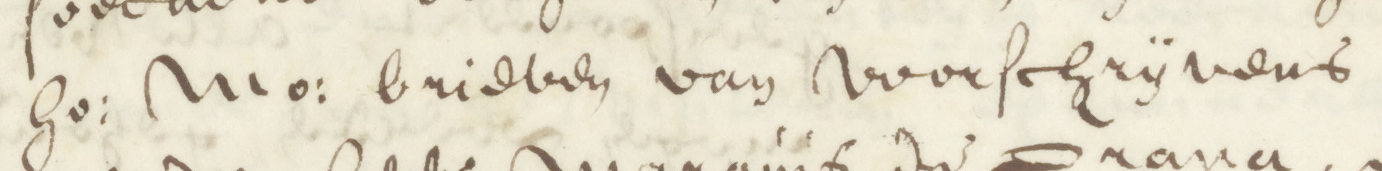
Ho:Mo: brieven van voorschrijvens
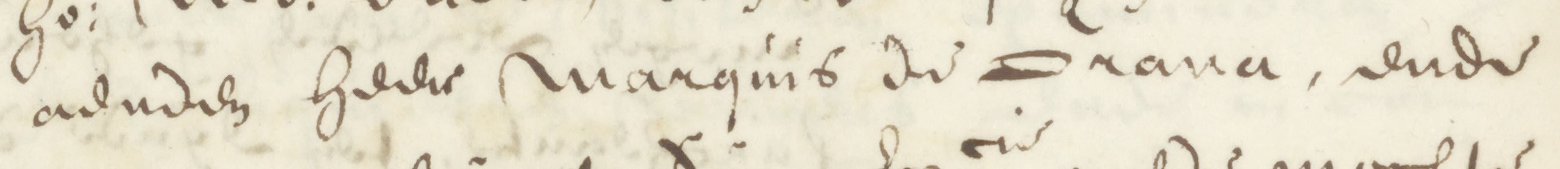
aenden heer Marquis de Grana, ende
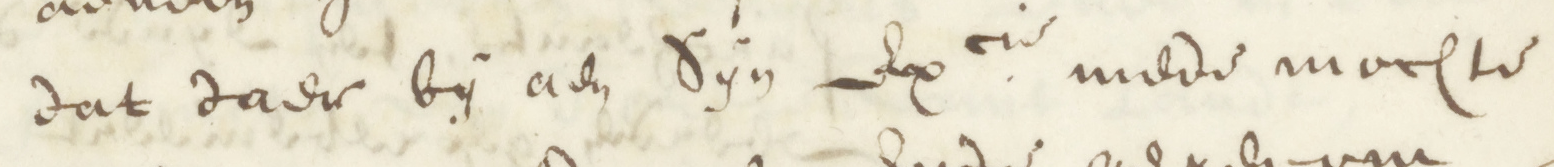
dat daer bij aen Sijn Excie. mede mochte
